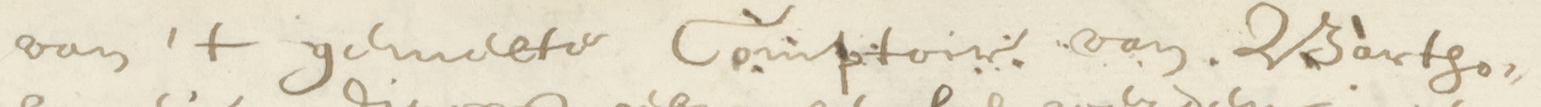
van 't gemelte Comptoir van Bartho„
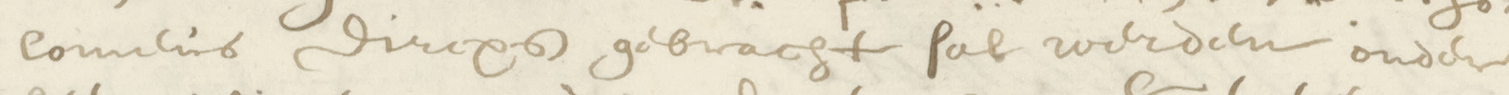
lomeus Dircxs gebracht sal werden onder
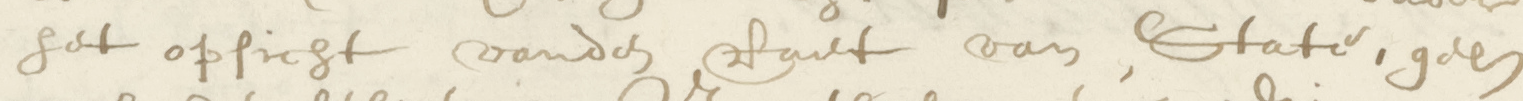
het opsicht vanden Raet van State, gel
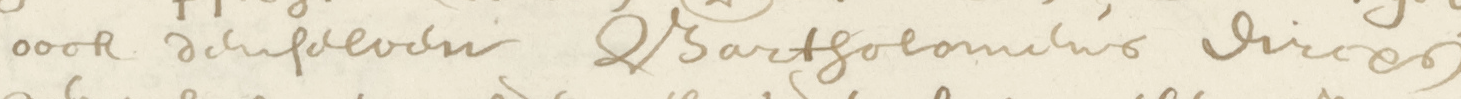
oock denselver Bartholomeus Dircxs
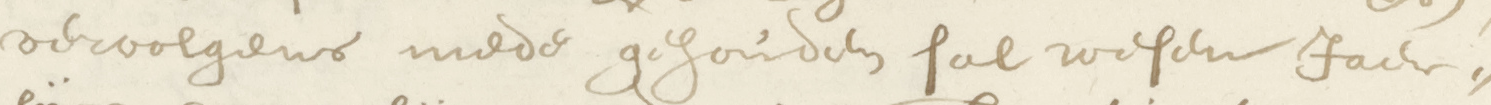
vervolgens mede gehouden sal wesen Jaer„
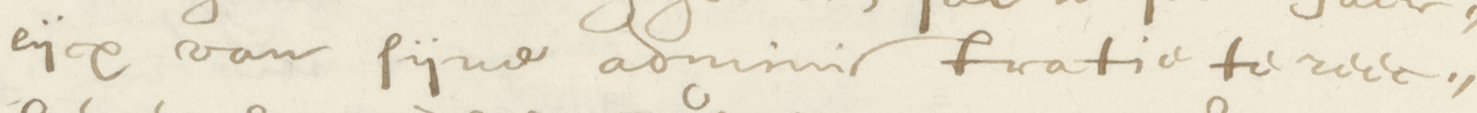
lijcx van sijne adminstratie te reec„
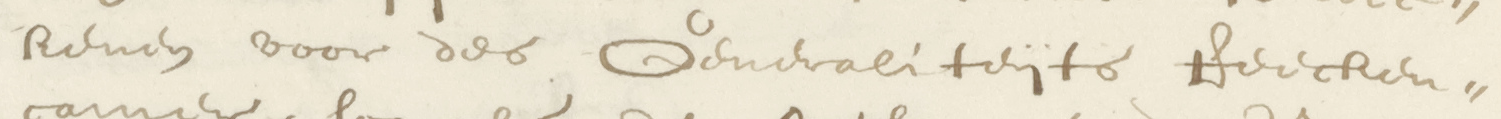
kenen voor des Generaliteijts Reecken„
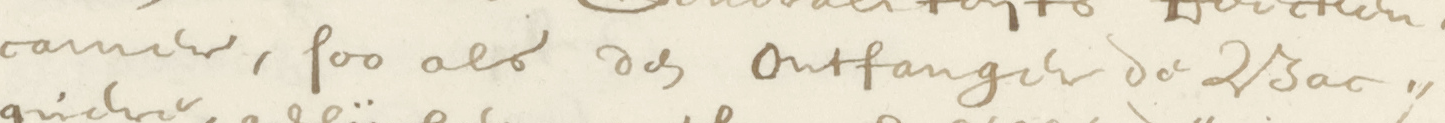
camer, soo als den Ontfanger de Bac„
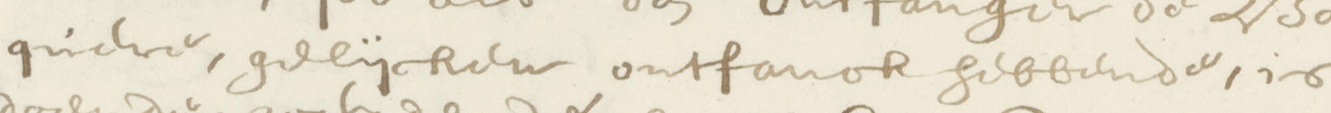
quere, gelijcken ontfanck hebbende, is
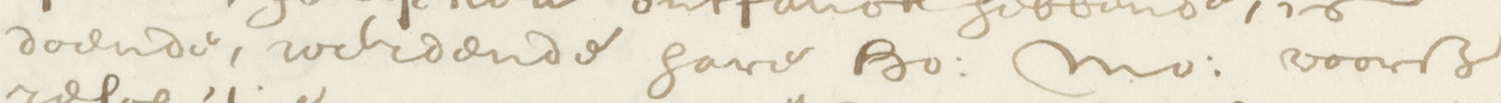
doende, werdende hare Ho:Mo: voors
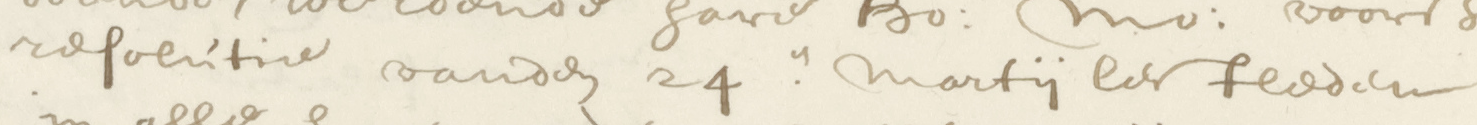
resolutie vanden 24e. Martij lestleden
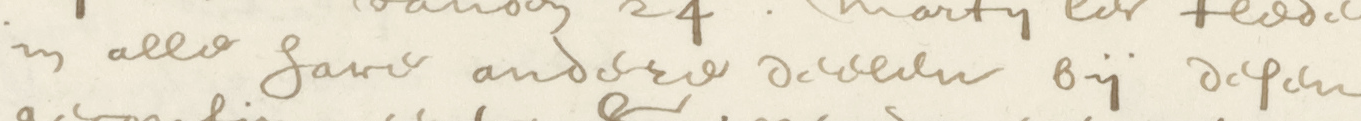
in alle hare andere deelen bij desen
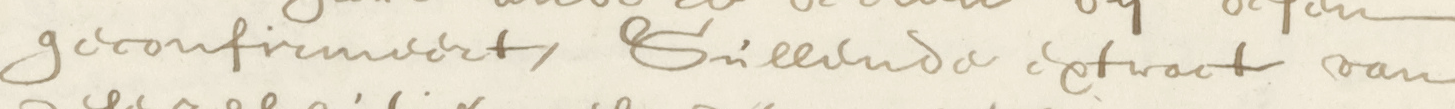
geconfirmeert, Sullende extract van
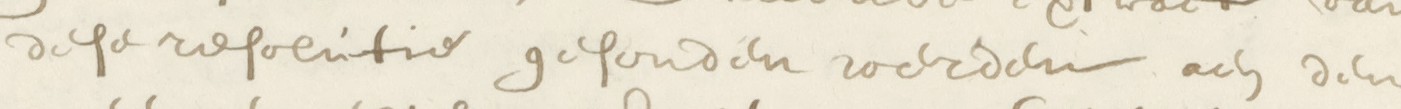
dese resolutie gesonden werden aen den
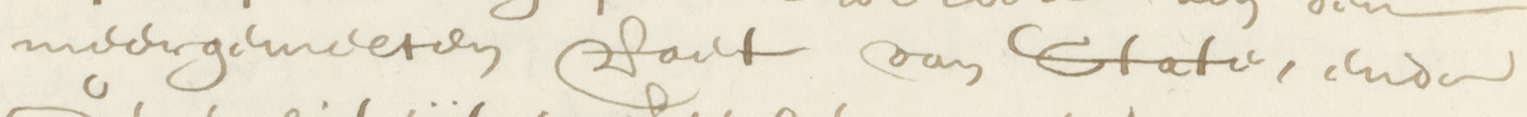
meergemelten Raet van State, ende
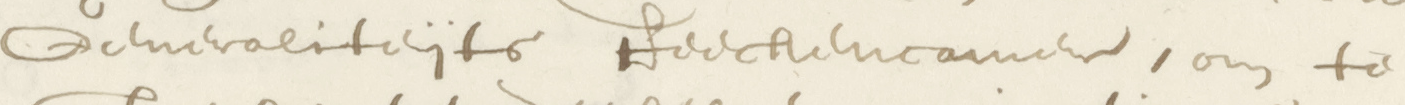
Generaliteijts Reeckencamer, om te
